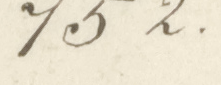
752.
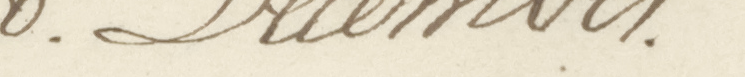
8. December.
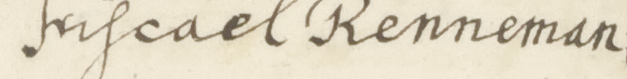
Fiscael Renneman
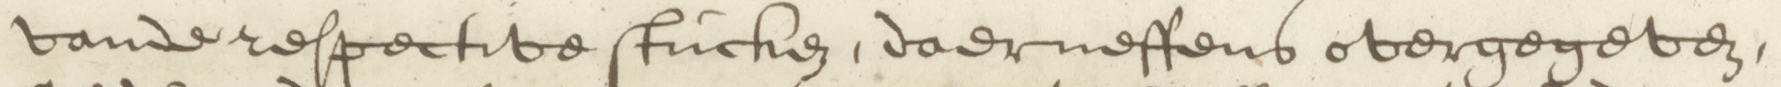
vande respective stucken, daerneffens overgegeven
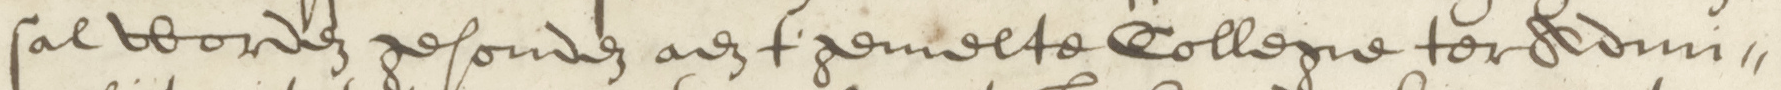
sal worden gesonden aen t'gemelte Collegie ter Admi„
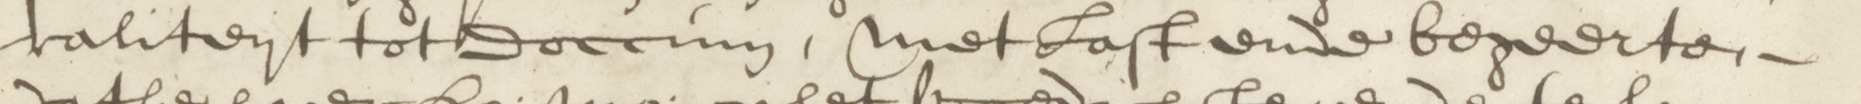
raliteijt tot doccum, met Last ende begeerte -
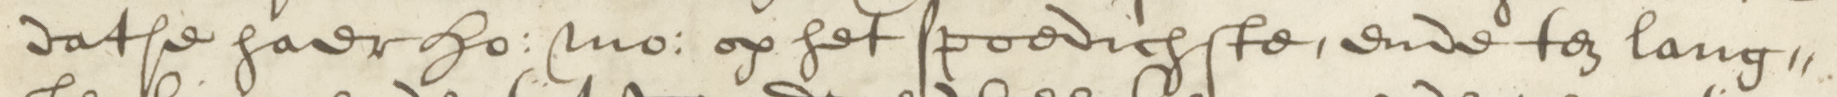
datse haer Ho:Mo: op het spoedichste ende ten lang„
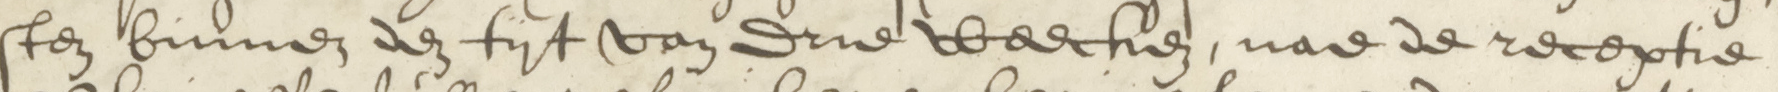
sten binnen den tijt van drie weecken, nae de receptie
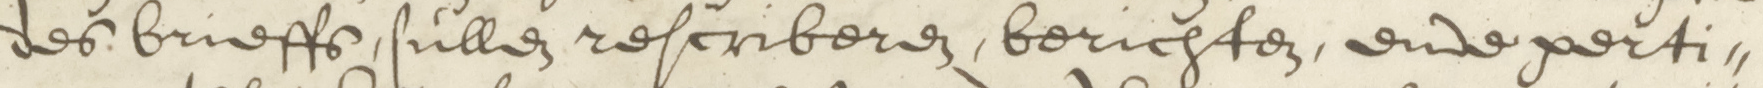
des brieffs, sullen rescriberen, berichten ende perti„
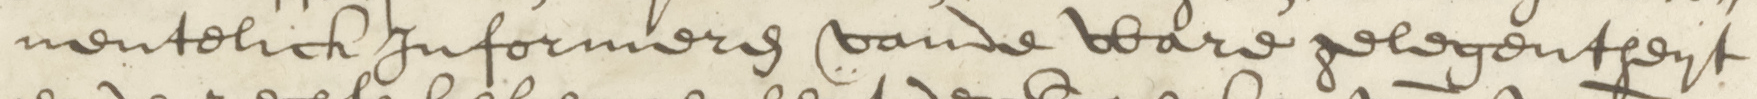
nentelick Informeren vande ware gelegentheijt
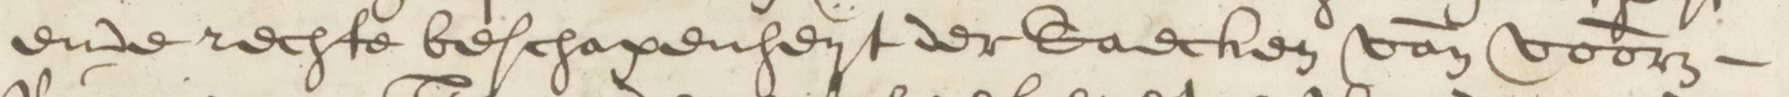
ende rechte beschapenheijt der Saecken van voorn -
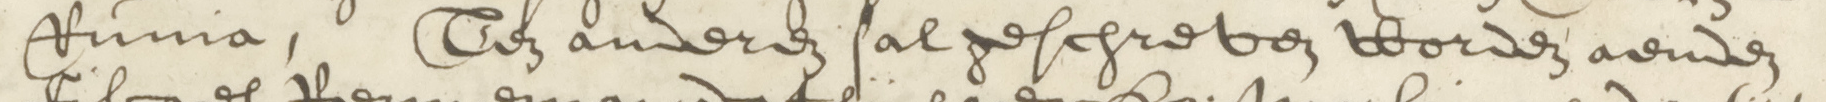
Runia. Ten anderen sal geschreevn worden aenden
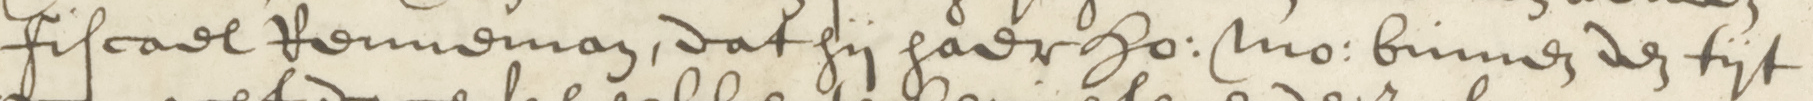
fiscael Renneman, dat hij haer Ho:Mo: binnen den tijt
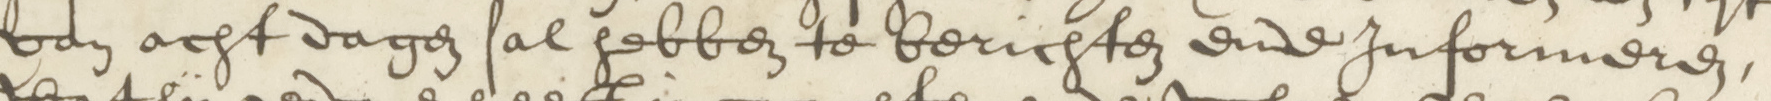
van acht dagen sal hebben te berichten ende Informeren,
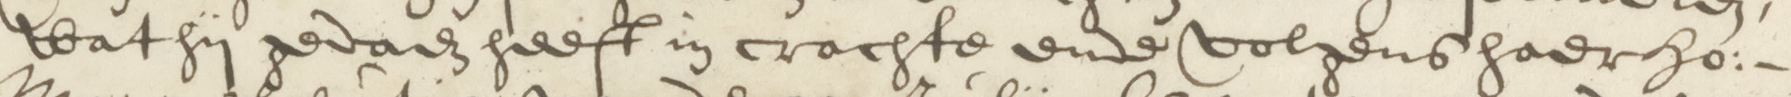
wat hij gedaen heeft in crachte ende volgens haer Ho: -
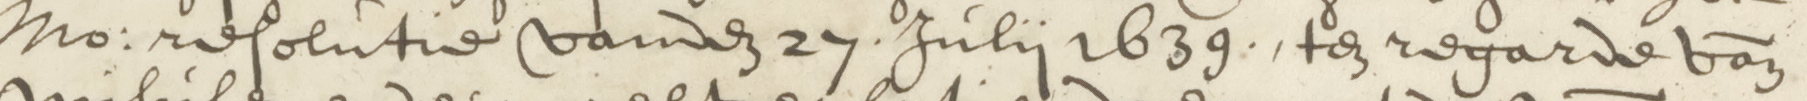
Mo: resolutie vanden 27 Julij 1639, ten regarde van
